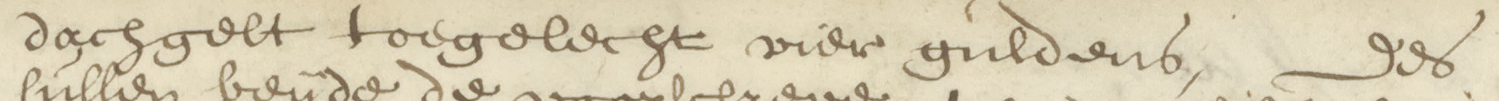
dachgelt toegelecht vier guldens. Des
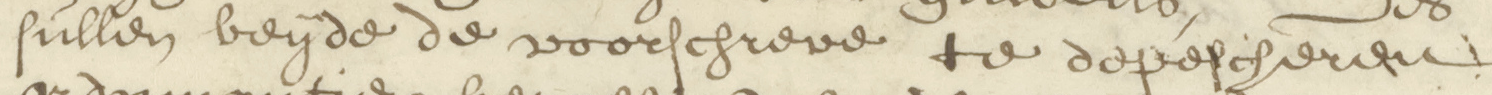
sullen beijde de voorschreve te depescheren
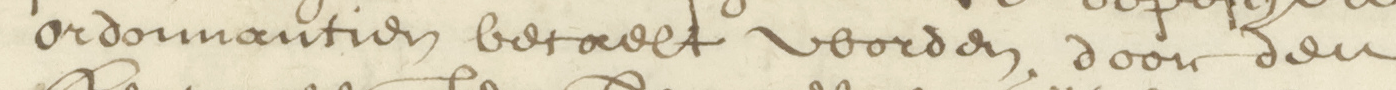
ordonnantien betaelt worden, door den
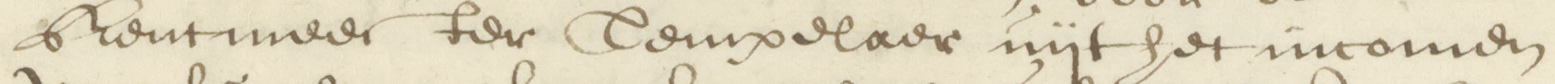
Rentmeester Tempelaer uijt het incomen
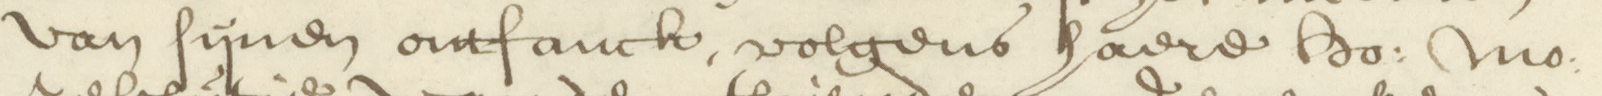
van sijnen ontfanck, volgens haere Ho:Mo:
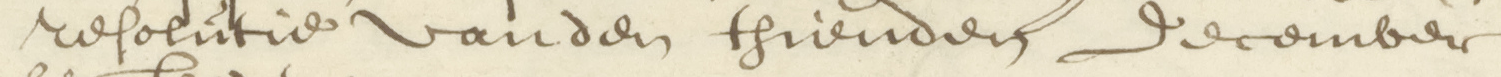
resolutie vanden thienden December
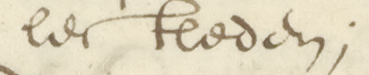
lestleden.
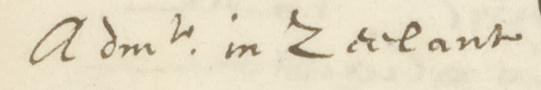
Admt. in Zeelant
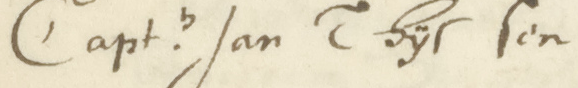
Captn. Jan Thijssen
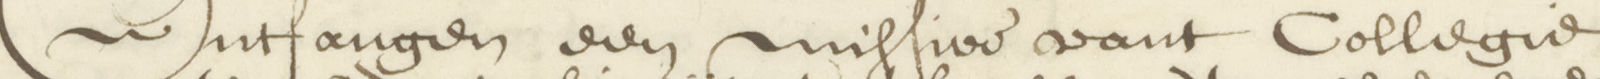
Ontfangen een Missive vant Collegie
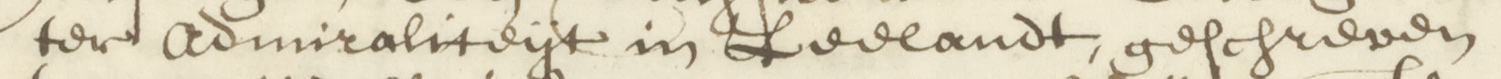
ter Admiraliteijt in Zeelandt, geschreven
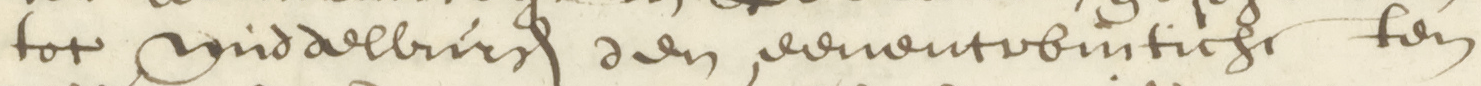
tot Middelburch den eenentwintichsten
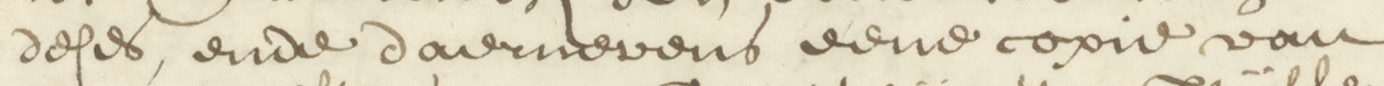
deses, ende daernevens eene copie van
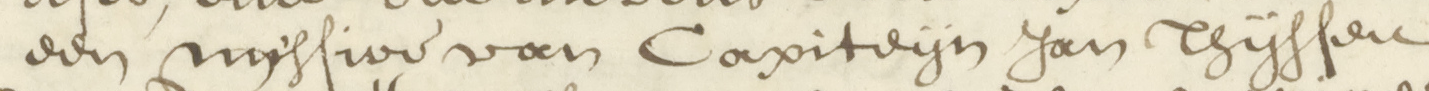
een Missive van Capiteijn Jan Thijssen
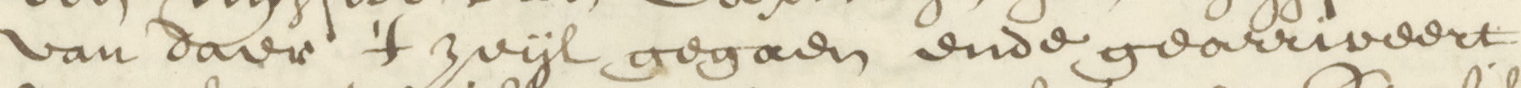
van daer 't zeijl gegaen ende gearriveert
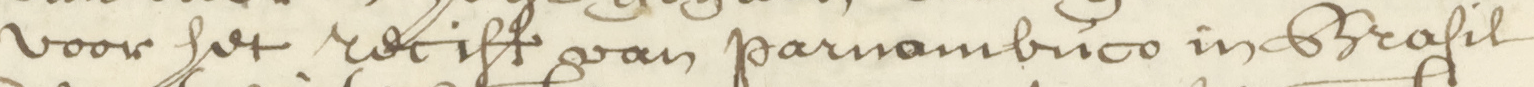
voor het reciff van Parnambuco in Brasil
